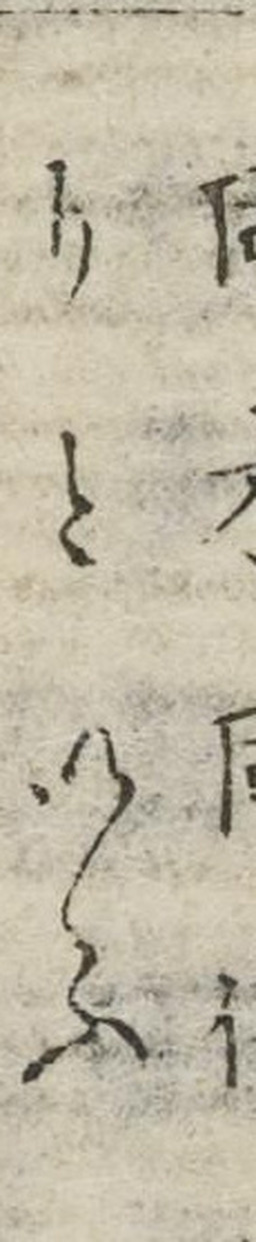りと云ふ
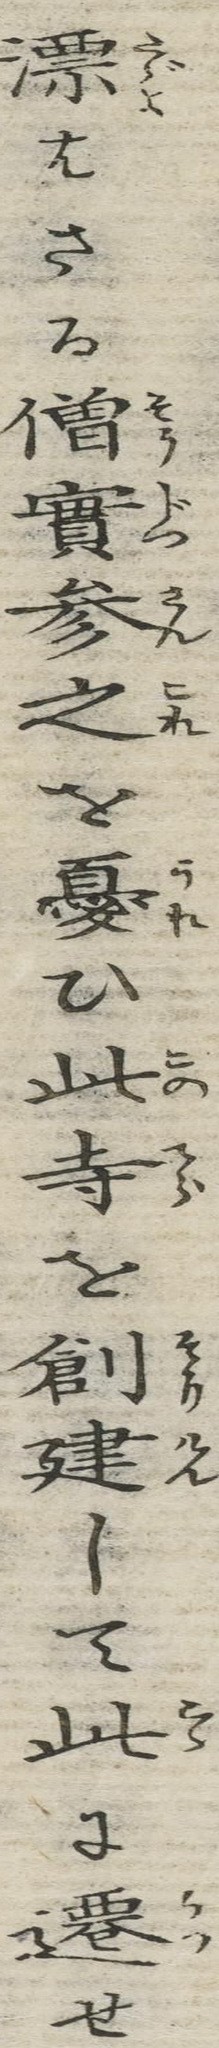漂はさる僧実参之を憂ひ此寺を創建して此に遷せ
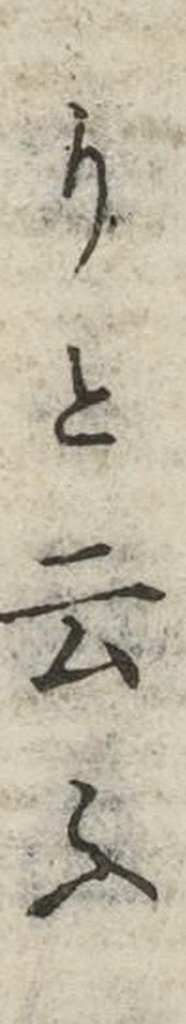りと云ふ
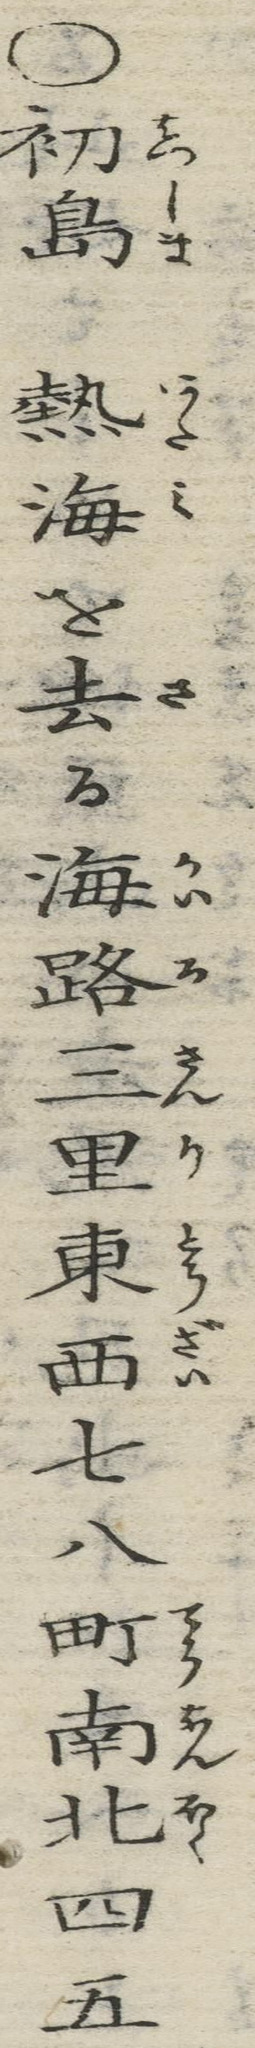○初島熱海を去る海路三里東西七八町南北四五
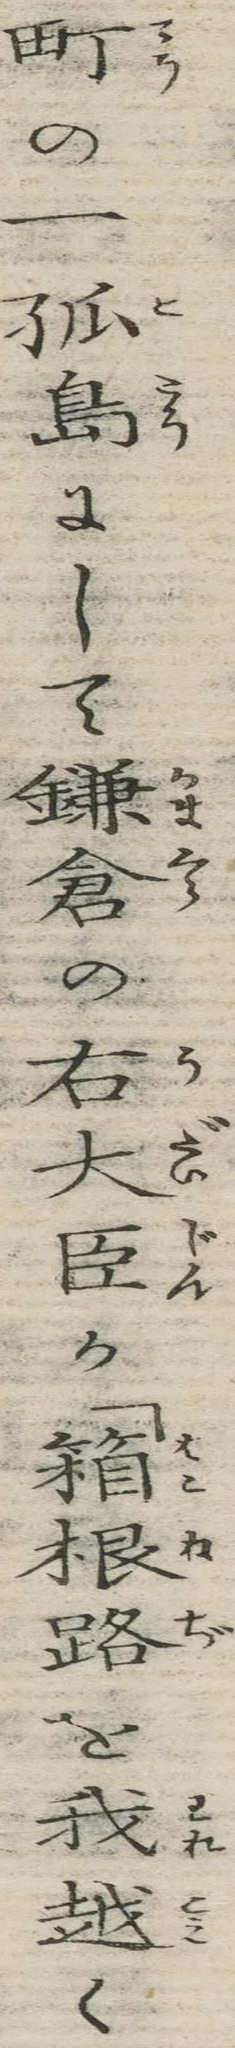町の一孤島にして鎌倉の右大臣か「箱根路を我越く
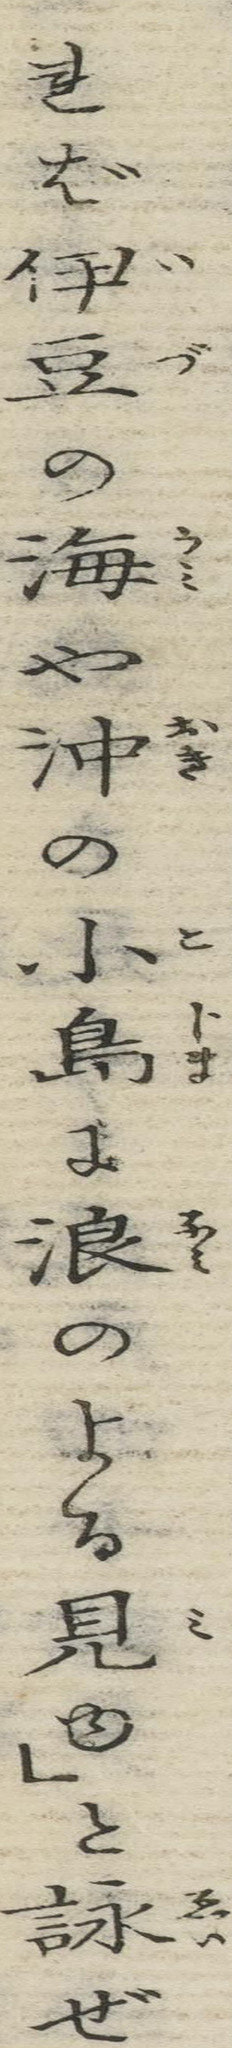れば伊豆の海や沖の小島に浪のよる見ゆ」と詠ぜ

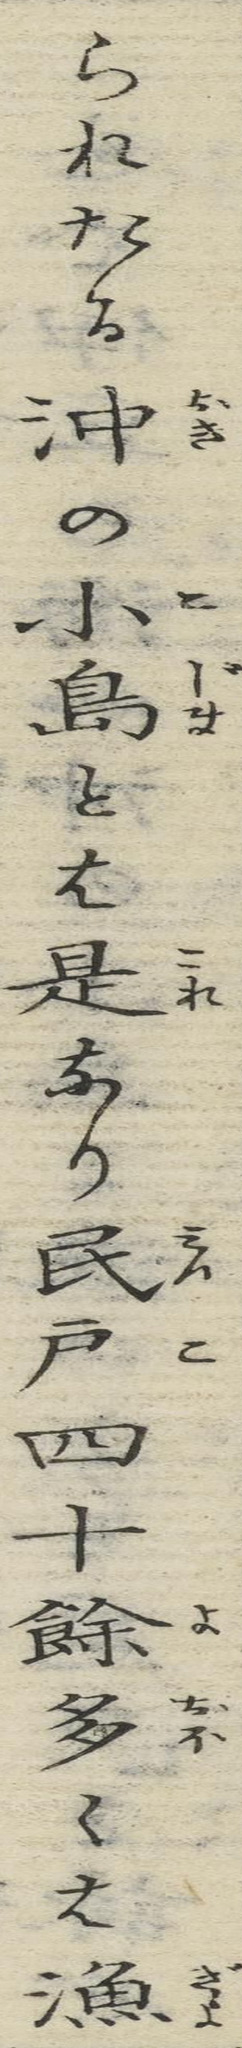られたる沖の小島とは是なり民戸四十余多くは漁
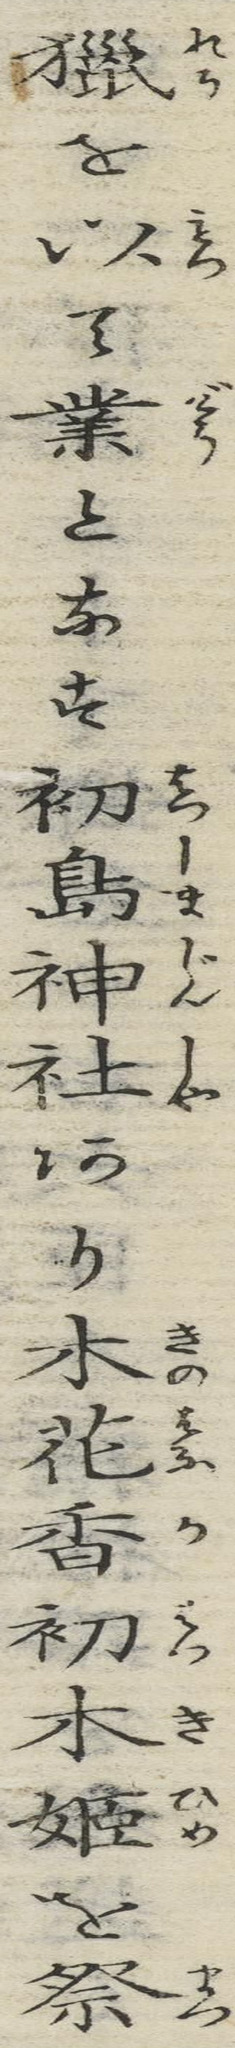猟を以て業となす初島神社あり木花香初木姫を祭
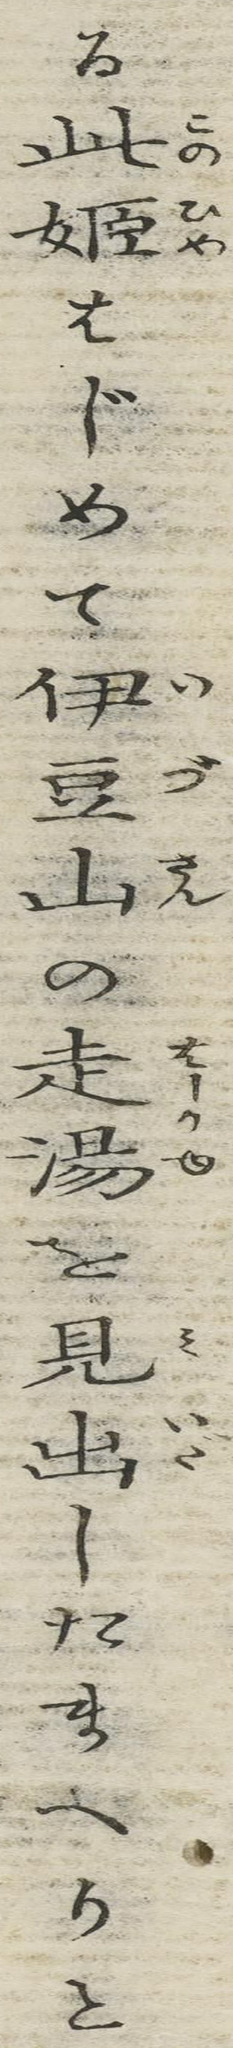る此姫はじめて伊豆山の走湯を見出したまへりと
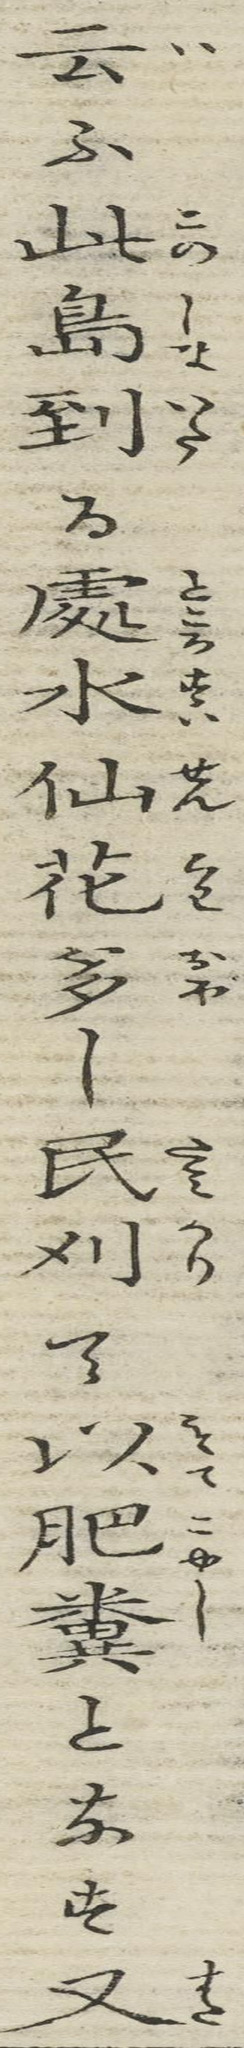云ふ此島到る処水仙花多し民刈て以肥糞となす又
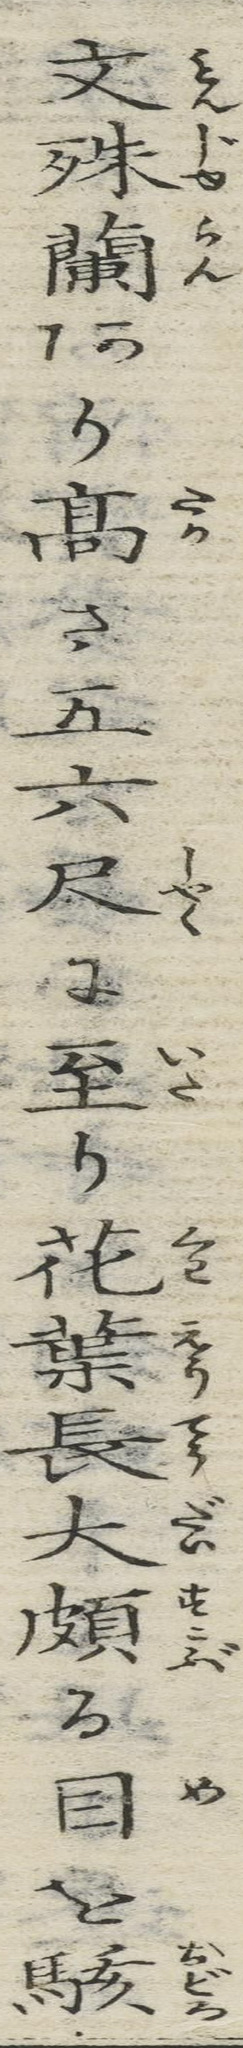文殊蘭あり高さ五六尺に至り花葉長大頗る目を駭
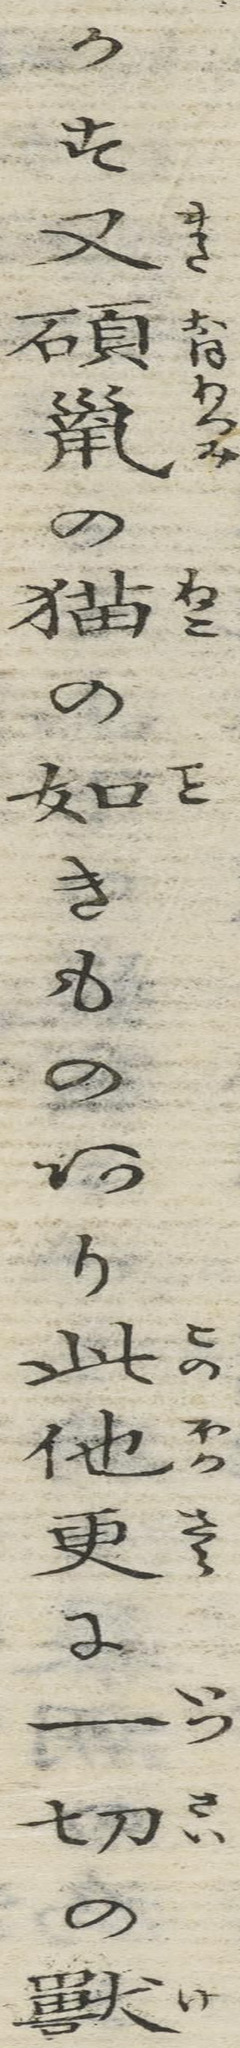かす又碩鼠の猫の如きものあり此他更に一切の獣
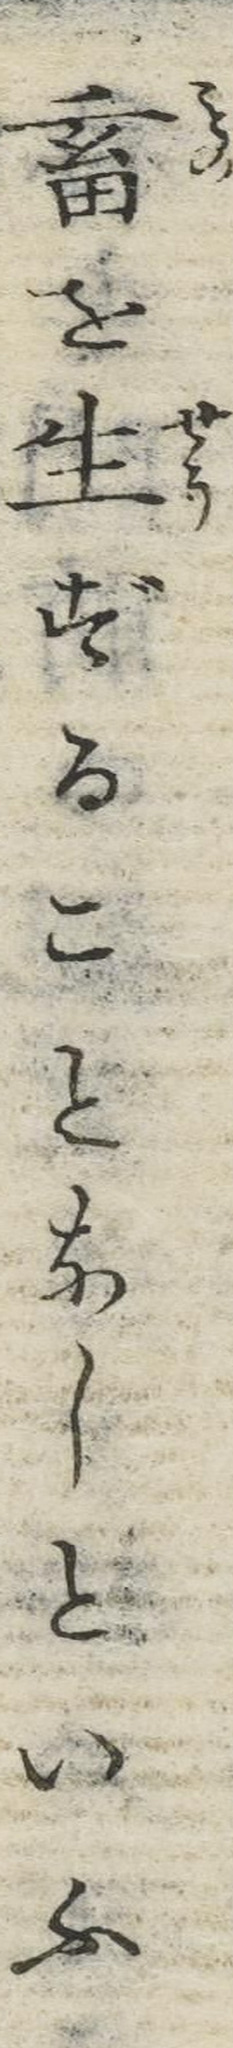畜を生ずることなしといふ
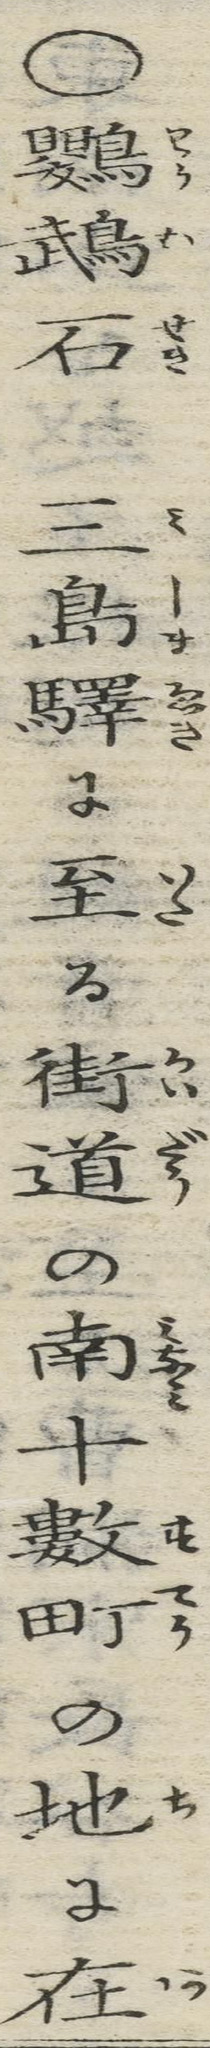○鸚鵡石三島駅に至る街道の南十数町の地に在
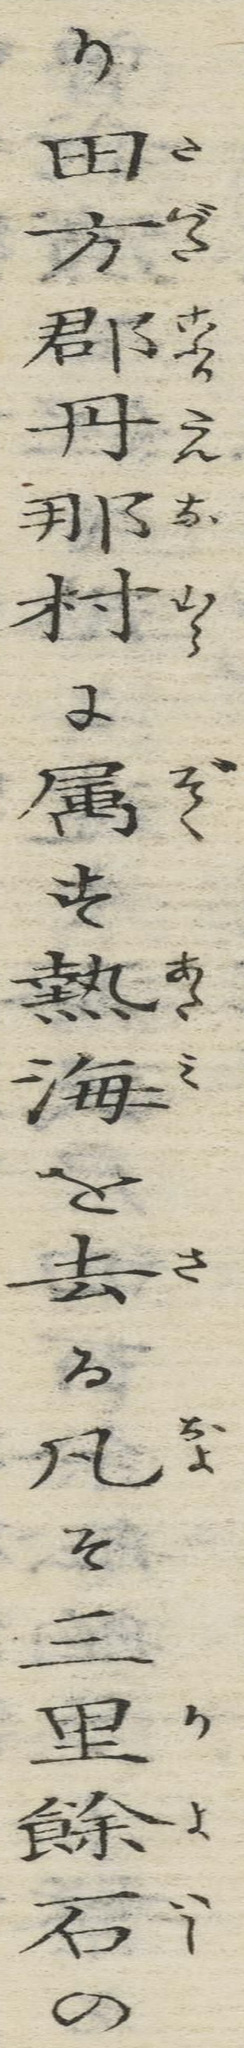り田方郡丹那村に属す熱海を去る凡そ三里余石の
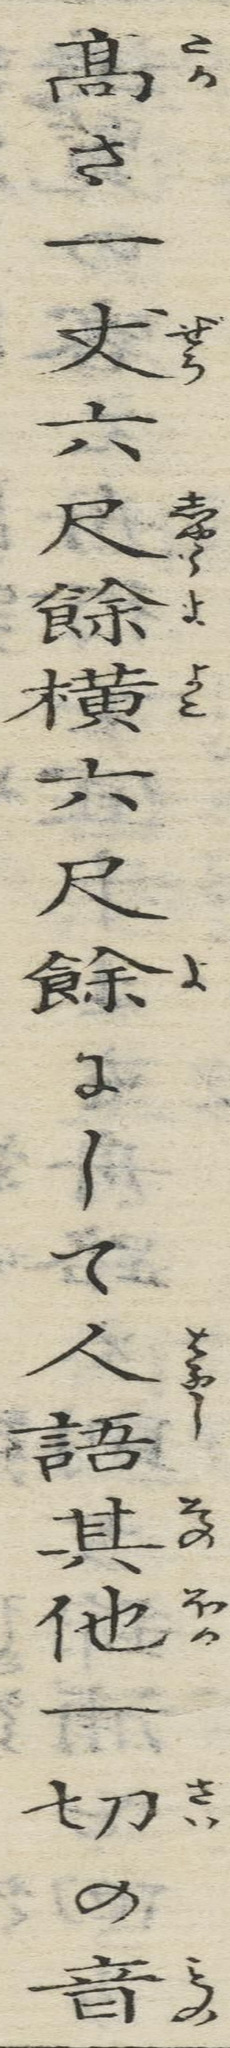高さ一丈六尺余横六尺余にして人語其他一切の音
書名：豆州熱海誌　完
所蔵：東京大学地震研究所図書室 Earthquake Research Institute Library, The University of Tokyo, JAPAN
